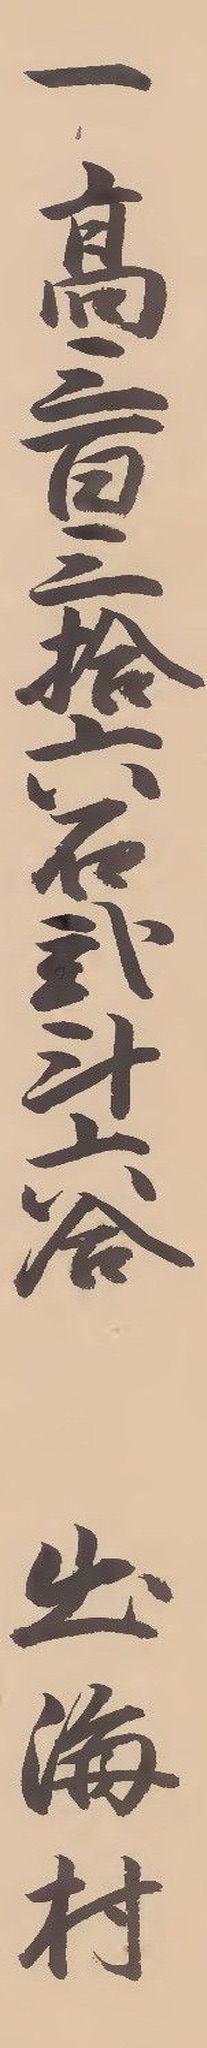一高三百三拾六石弐斗六合出海村
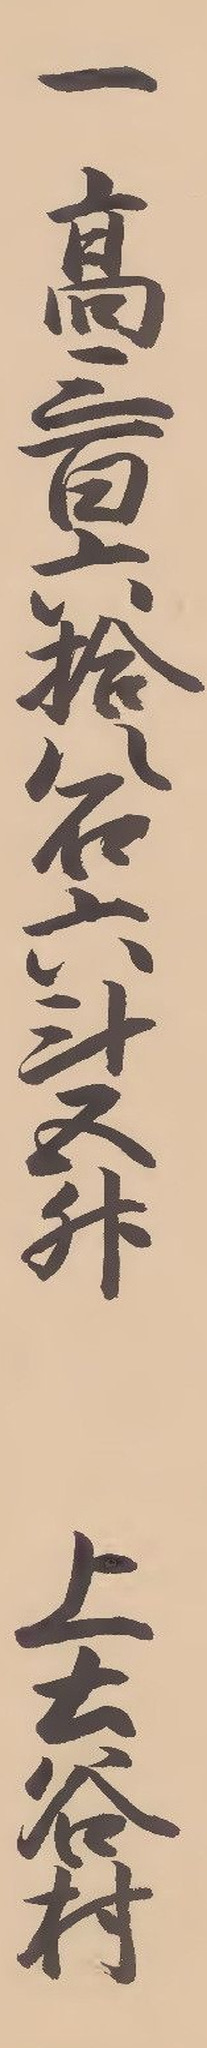一高三百六拾八石六斗五升上土谷村
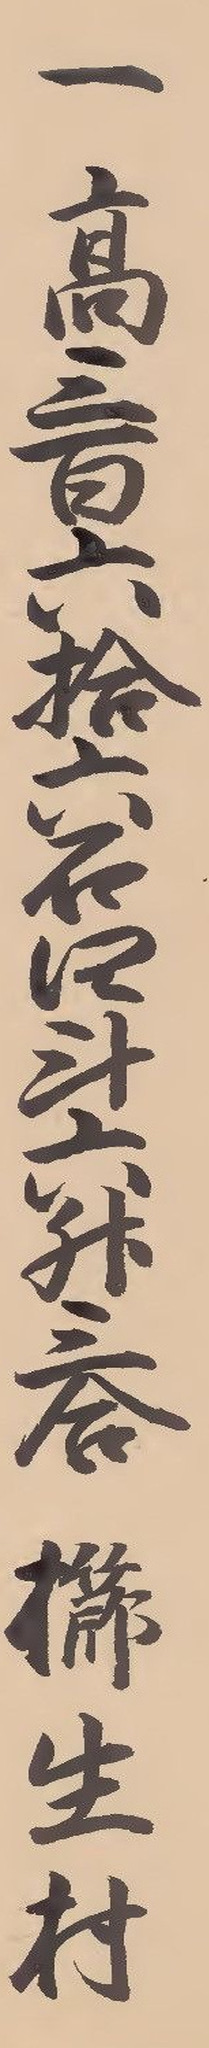一高三百六拾六石四斗六升三合櫛生村
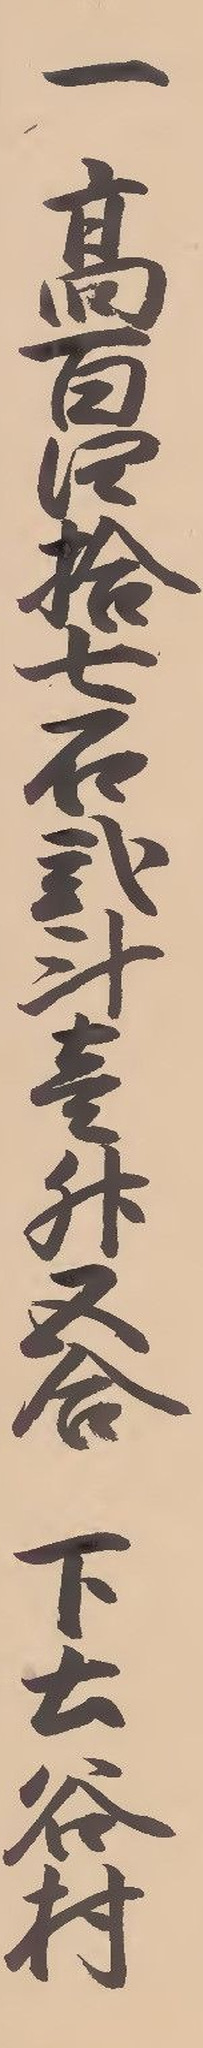一高百四拾七石弐斗壱升五合下土谷村
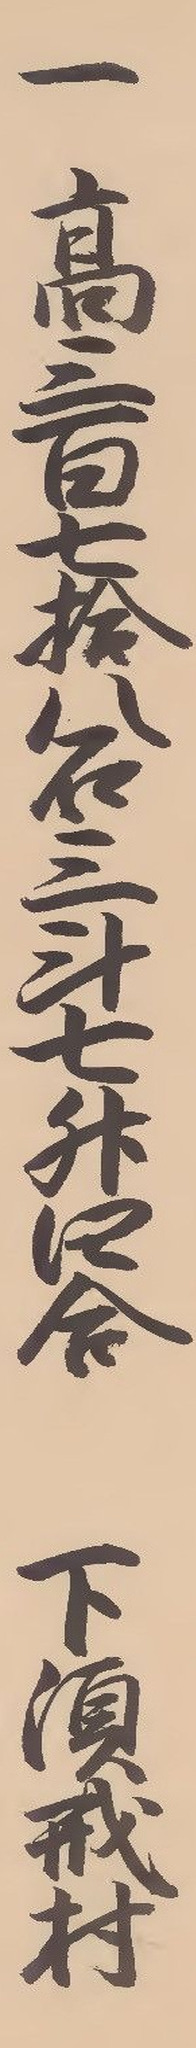一高三百七拾八石三斗七升四合下須戒村
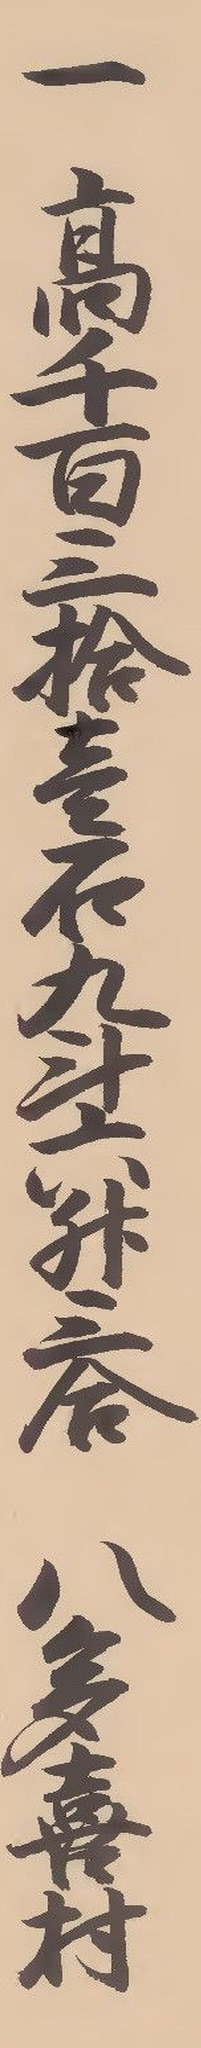一高千百三拾壱石九斗六升三合八多喜村
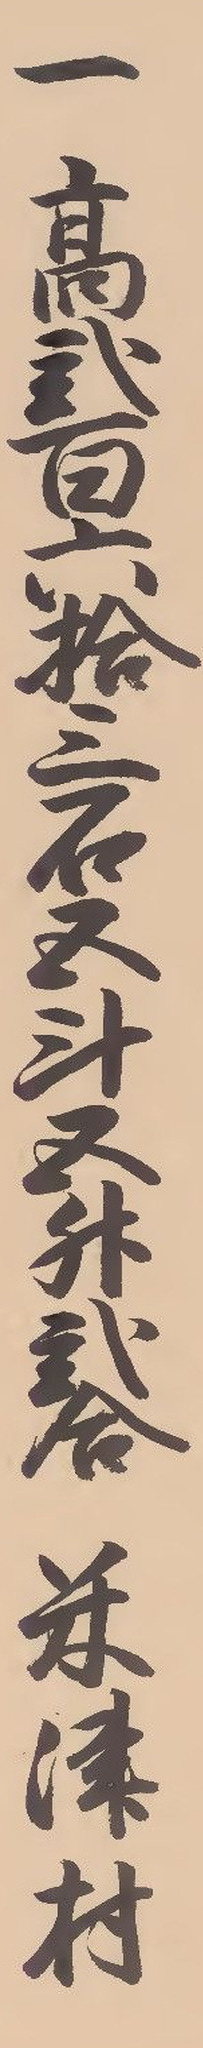一高弐百六拾三石五斗五升弐合米津村

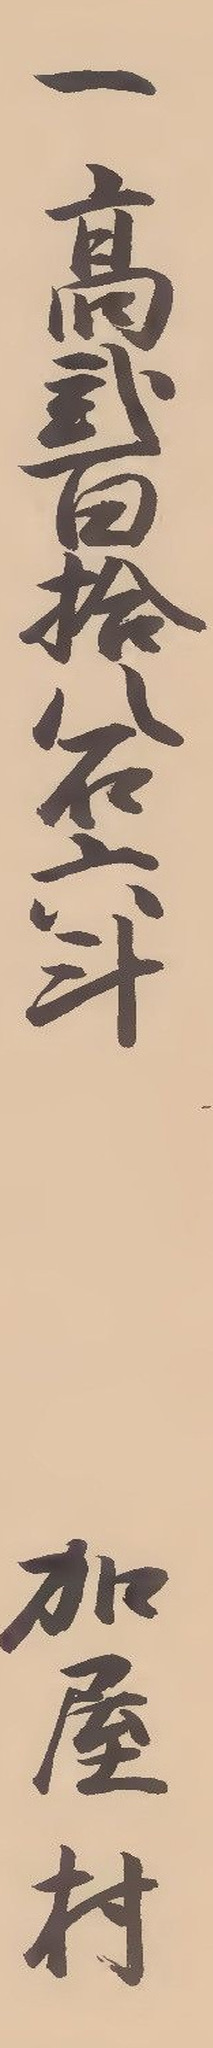一高弐百拾八石六斗加屋村
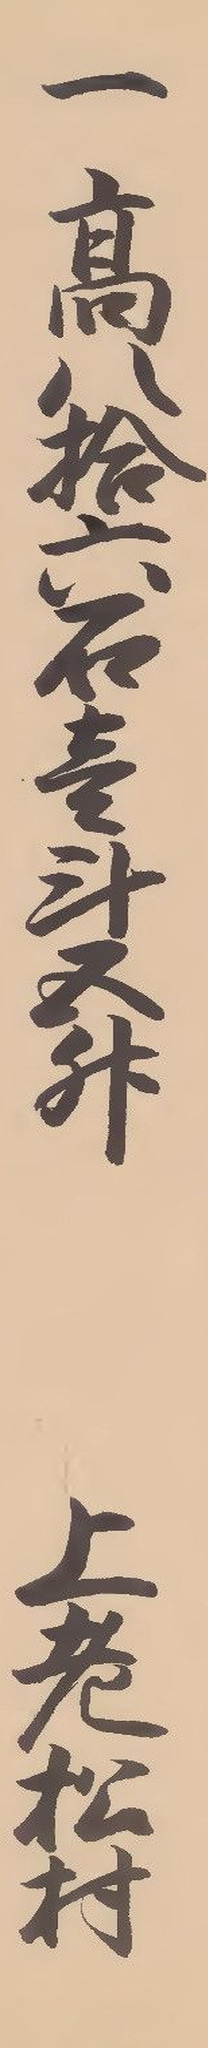一高八拾六石壱斗五升上老松村
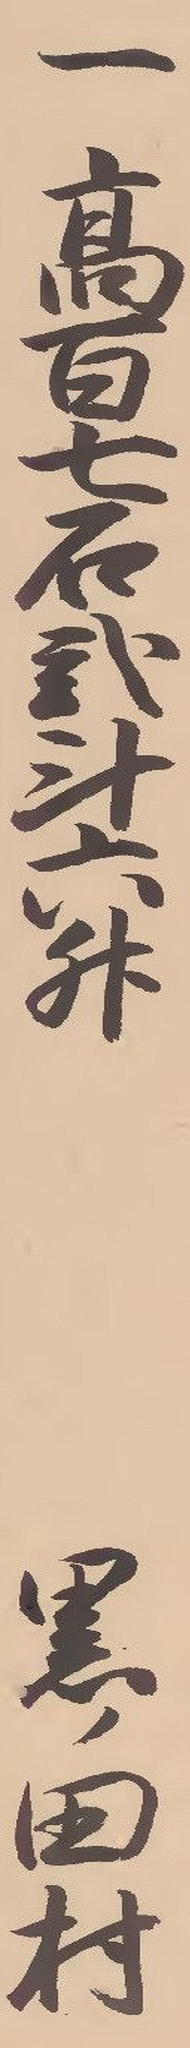一高百七石弐斗六升黒ノ田村
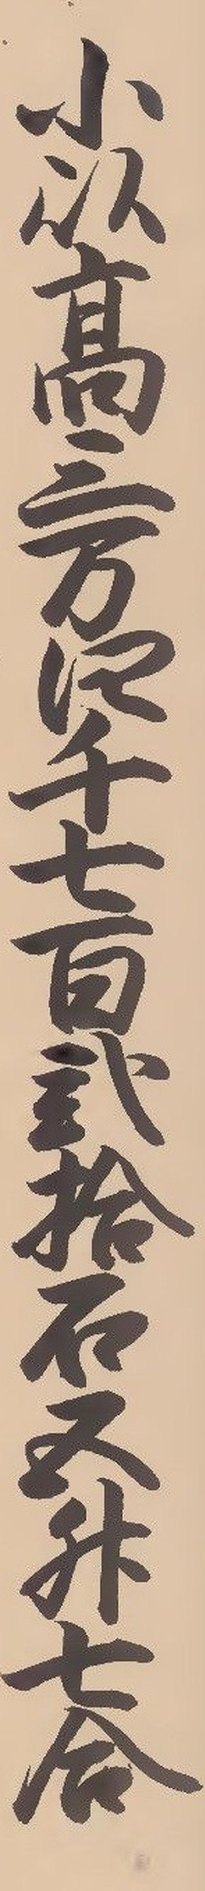小以高三万四千七百弐拾石五升七合

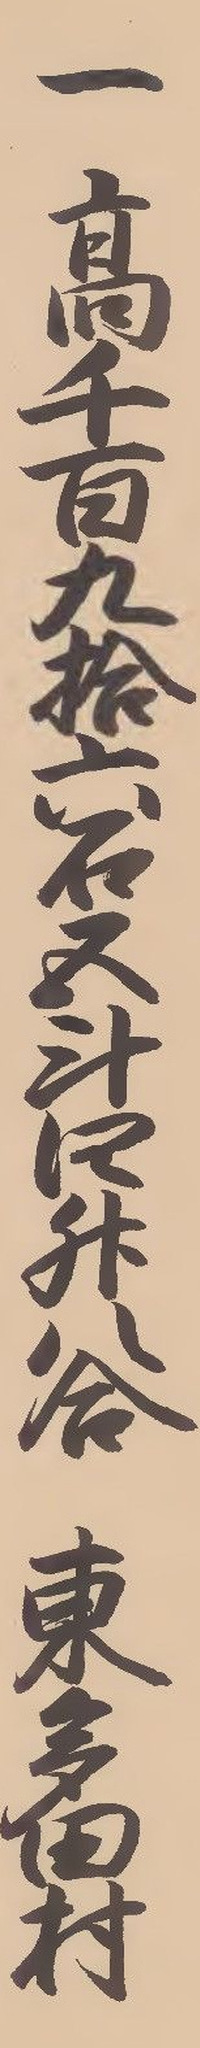一高千百九拾六石五斗四升八合東多田村
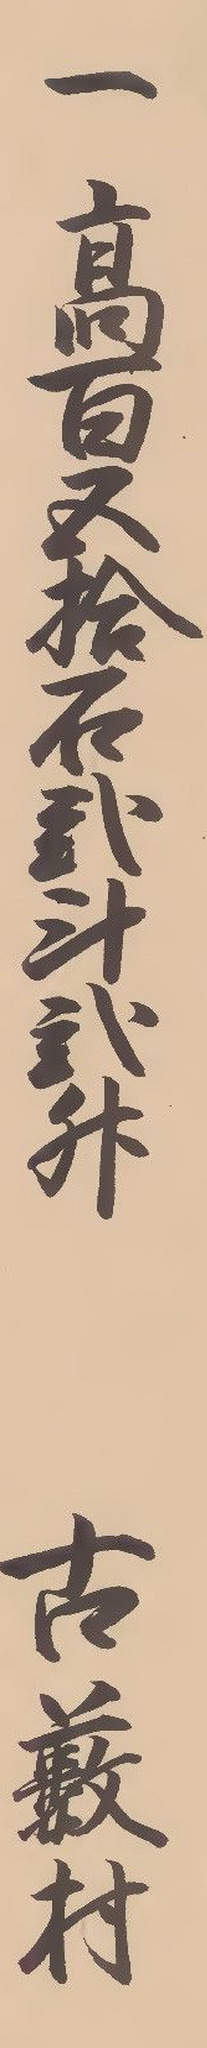一高百五拾石弐斗弐升古薮村
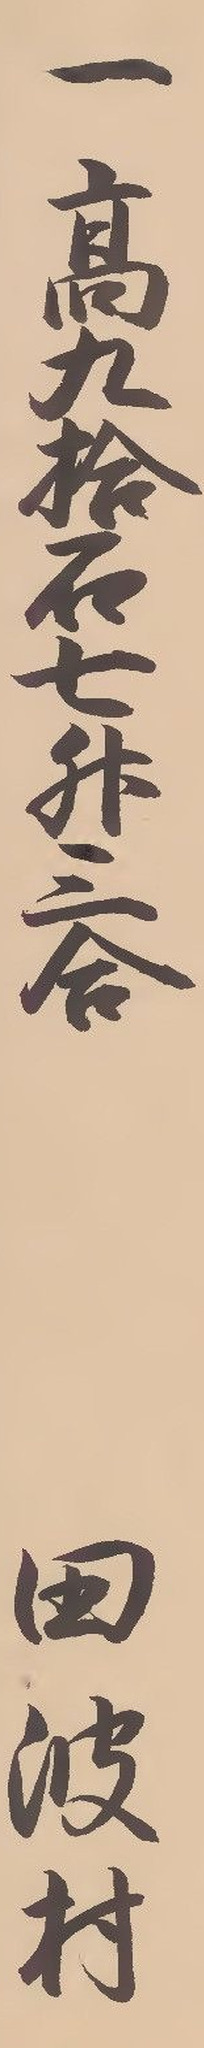一高九拾石七升三合田波村
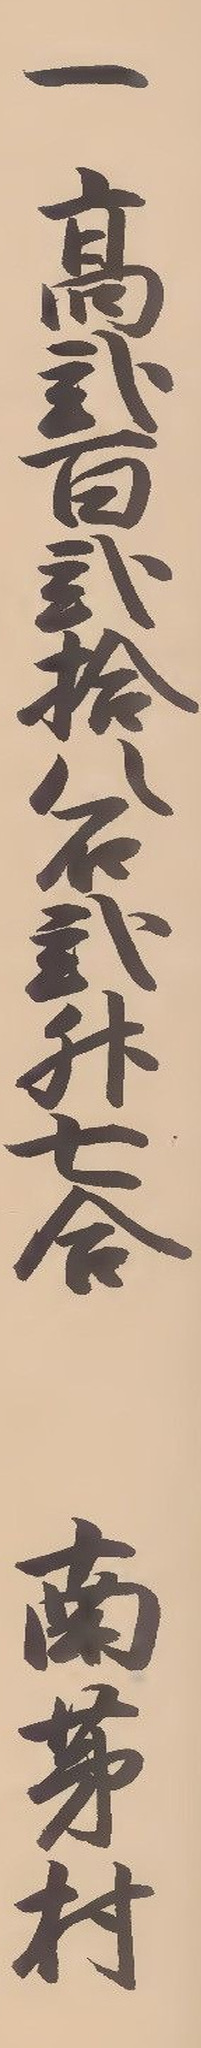一高弐百弐拾八石弐升七合南茅村
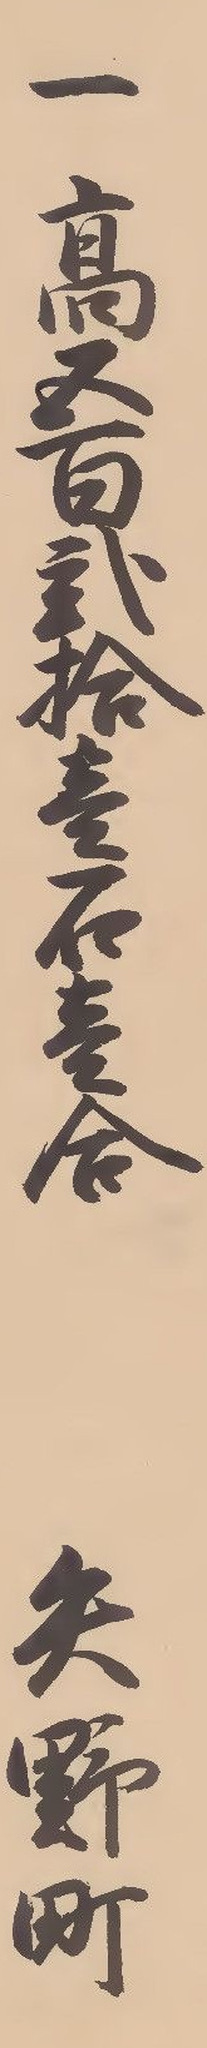一高五百弐拾壱石壱合矢野町
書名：伊予国郷帳
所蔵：国立公文書館 National Archives of Japan
